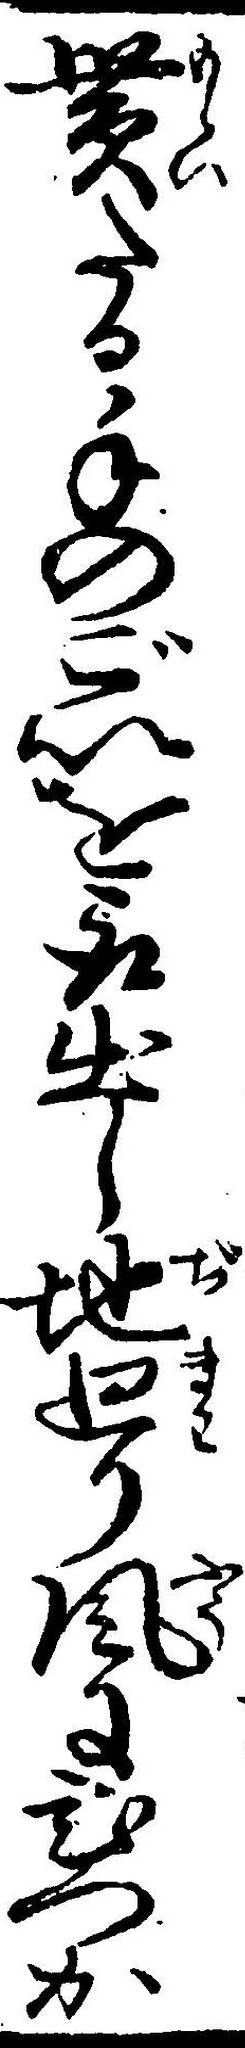貰たる手のごいを取出し地廻り風にひつか
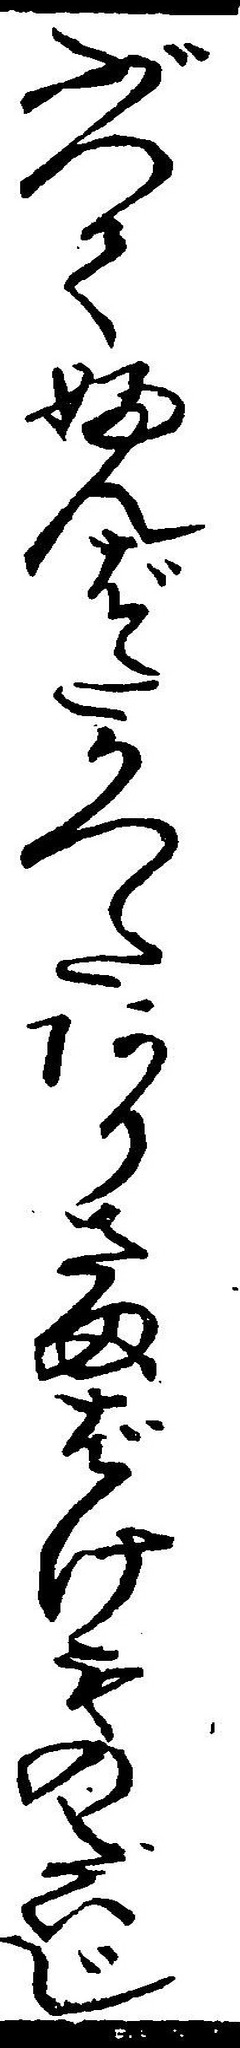ぶつてふんばたかつたありさまばけものたいじ
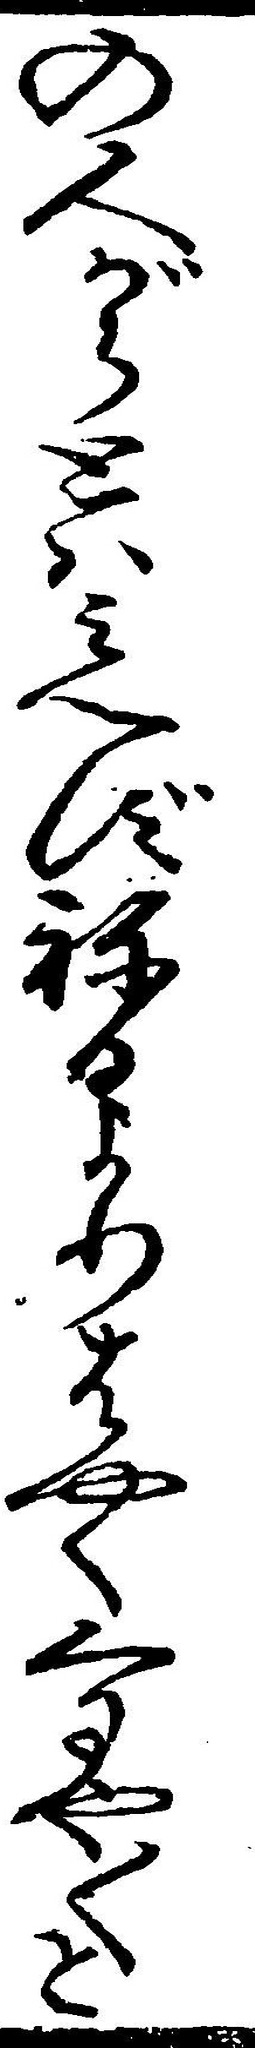の人がらとはみへずねるよりはやくくわや〳〵と
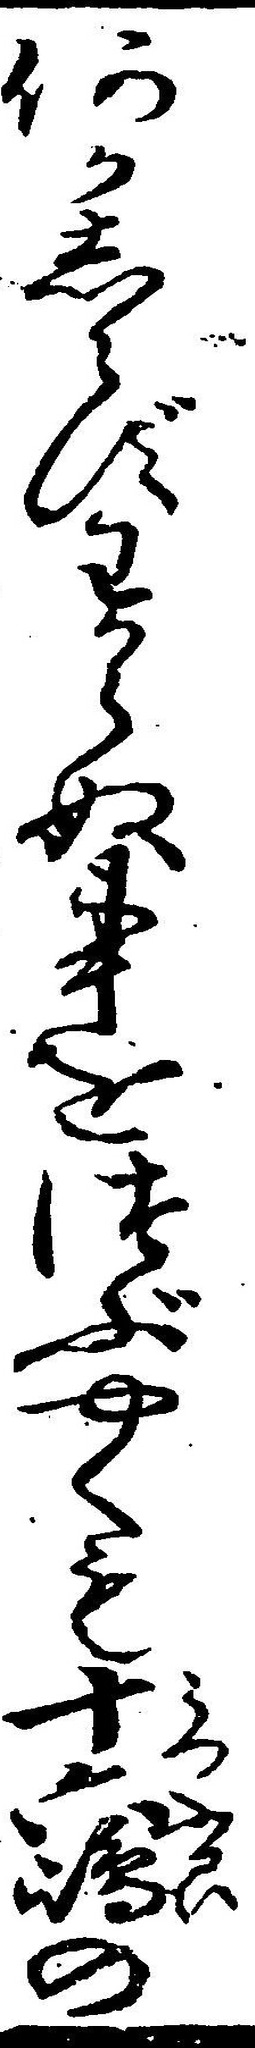何かしらずわからぬ事をつぶやくも十六島の
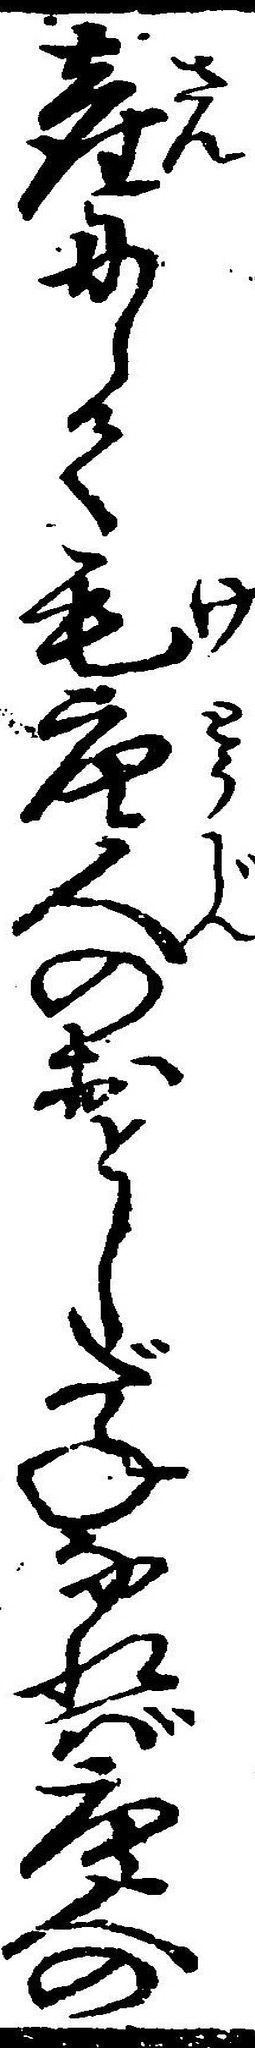産にして毛唐人のおとしだねなれば唐人の

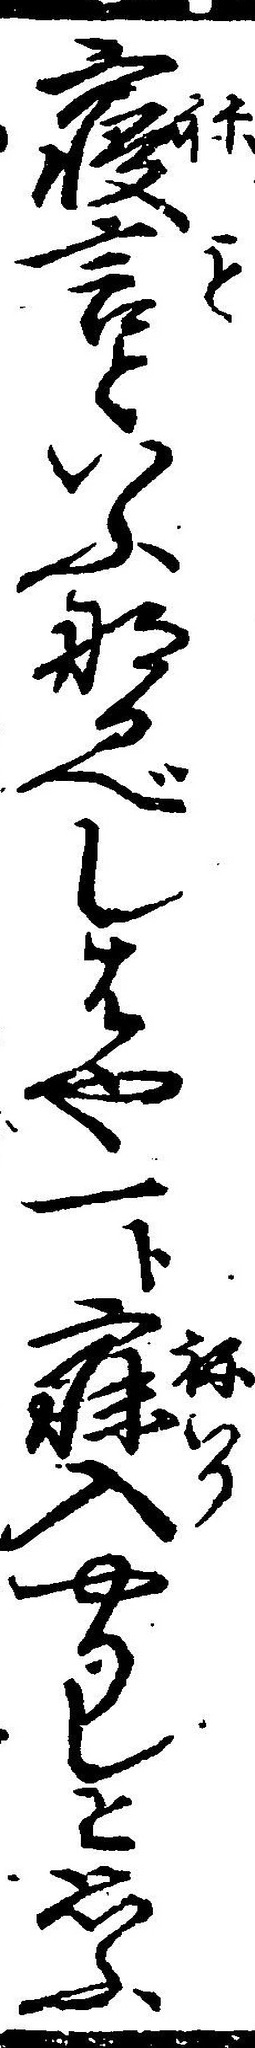寝言といふなるべしはや一寝入やりしと思ふ
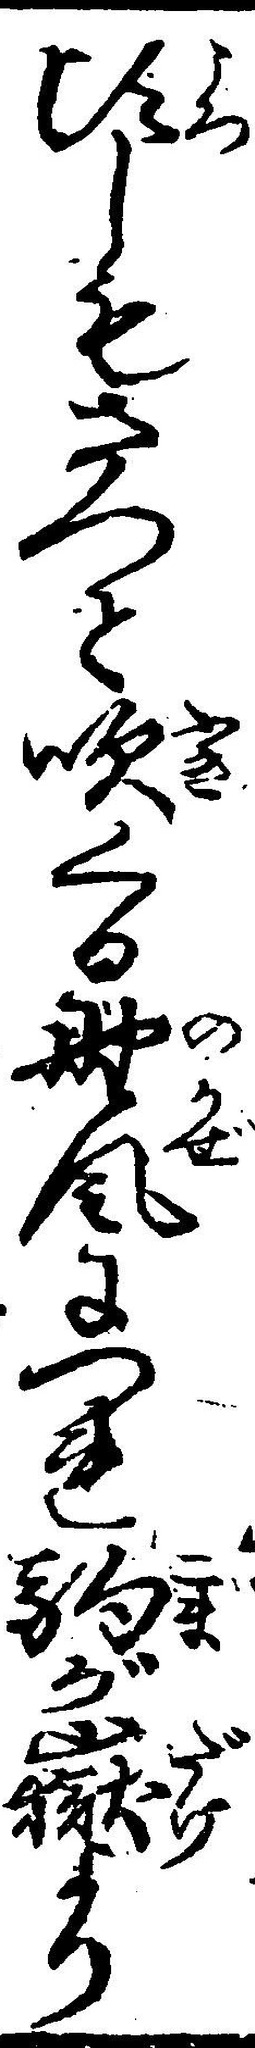頃しもさつと吹くる野風につれ駒が岳より
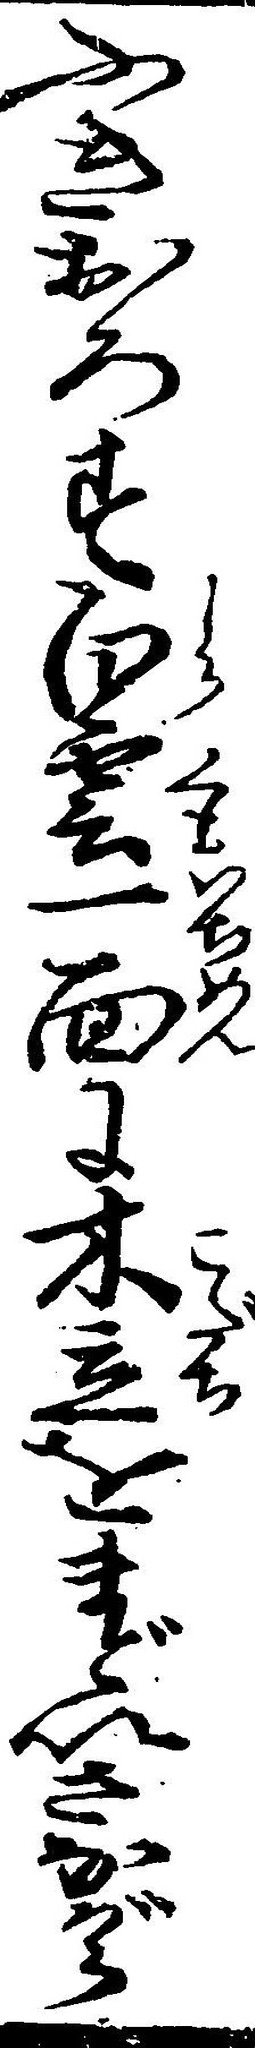ふきおろす白雲一面に木立をまどいさながら
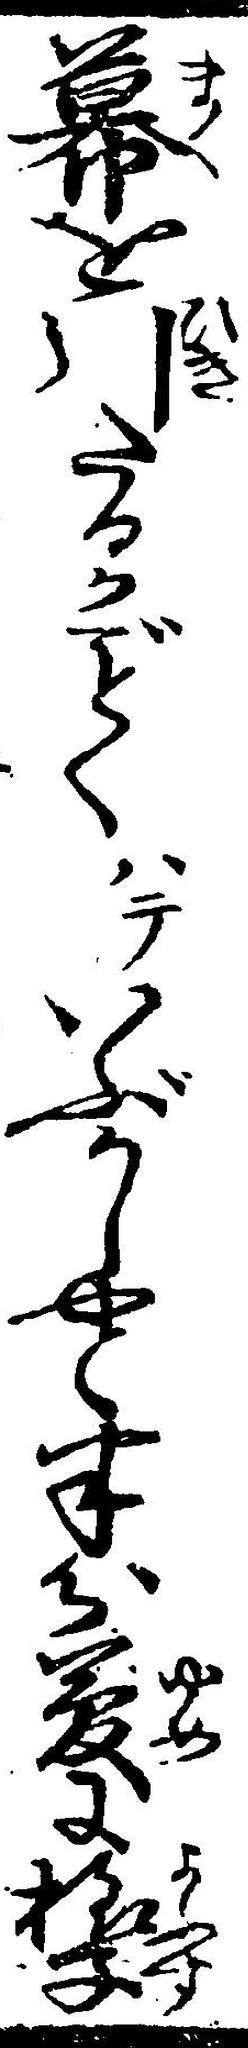幕を引たるかごとくいぶかしやと半分夢に様子
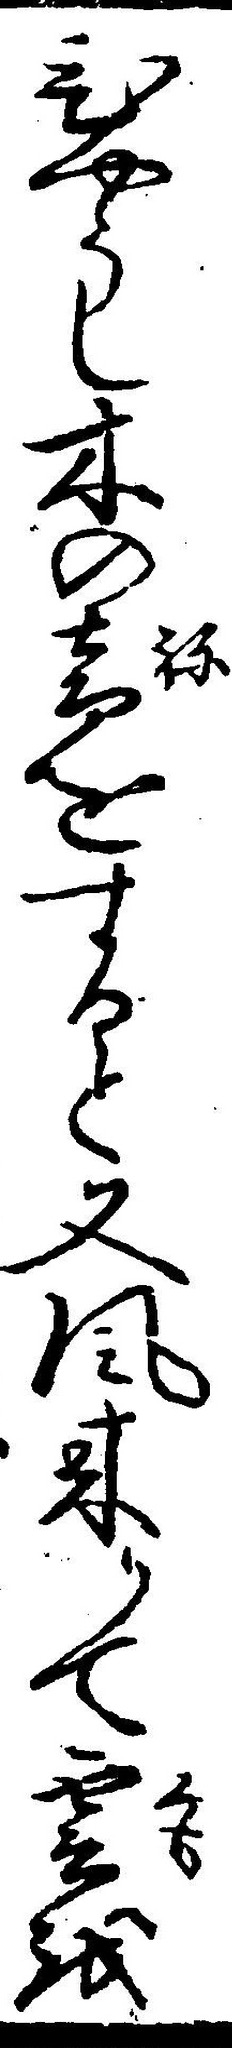ひやうし木の音をすると又風来て雲を
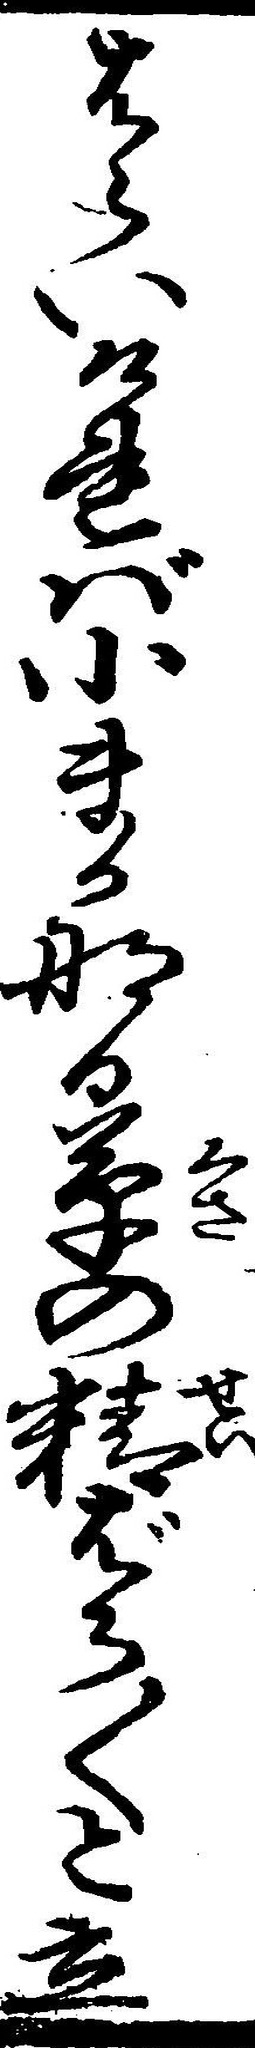はらいければ小まかなる草の精ばら〳〵と立
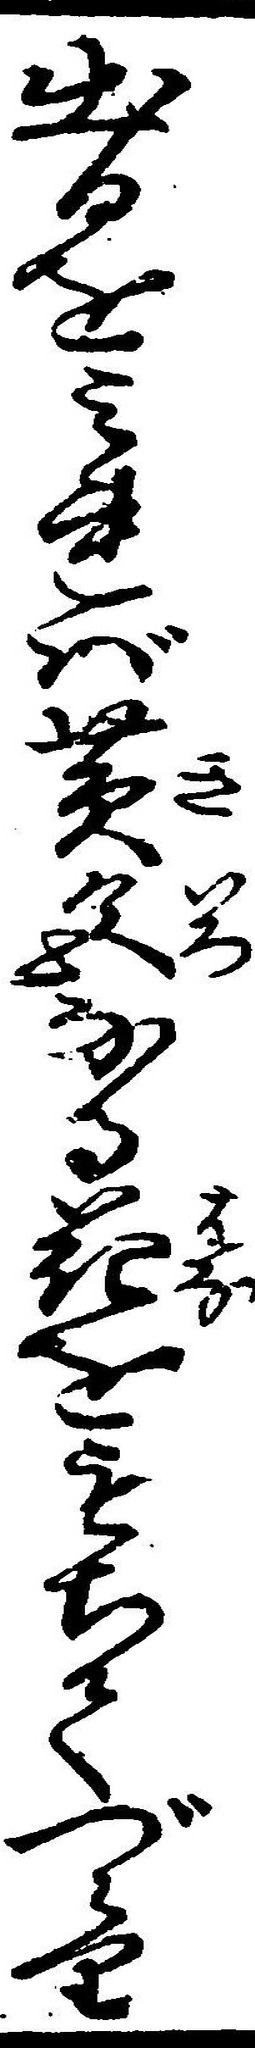出るをみれば黄色なる花をもちてづらり
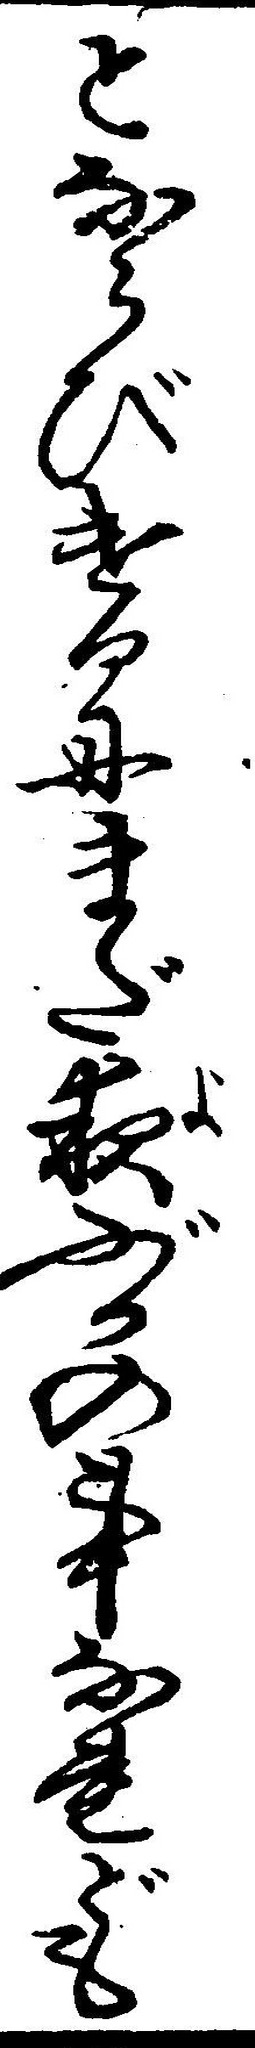とならびけるにまだ夜ぶかの事なれども
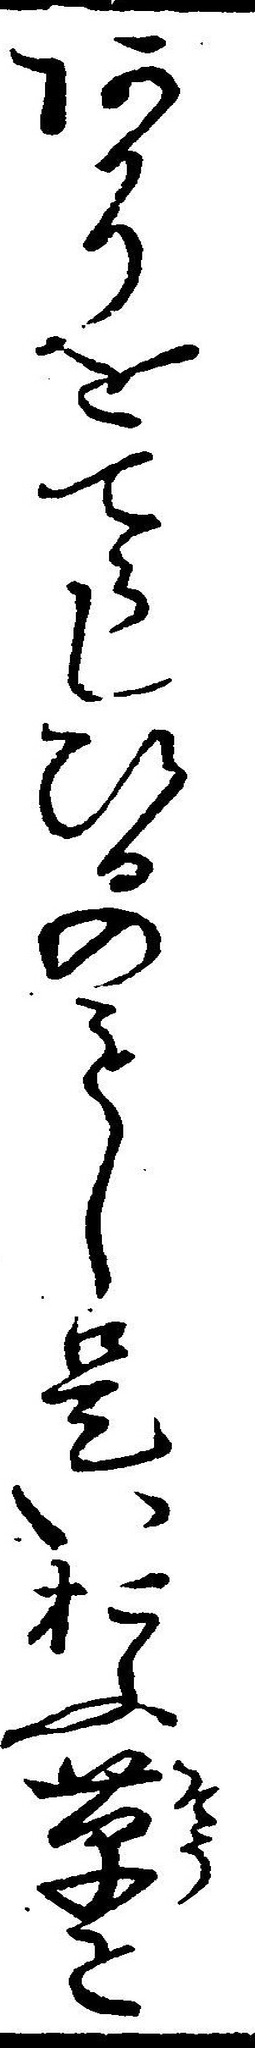あかりをてらしひるのことし是いおふ草と
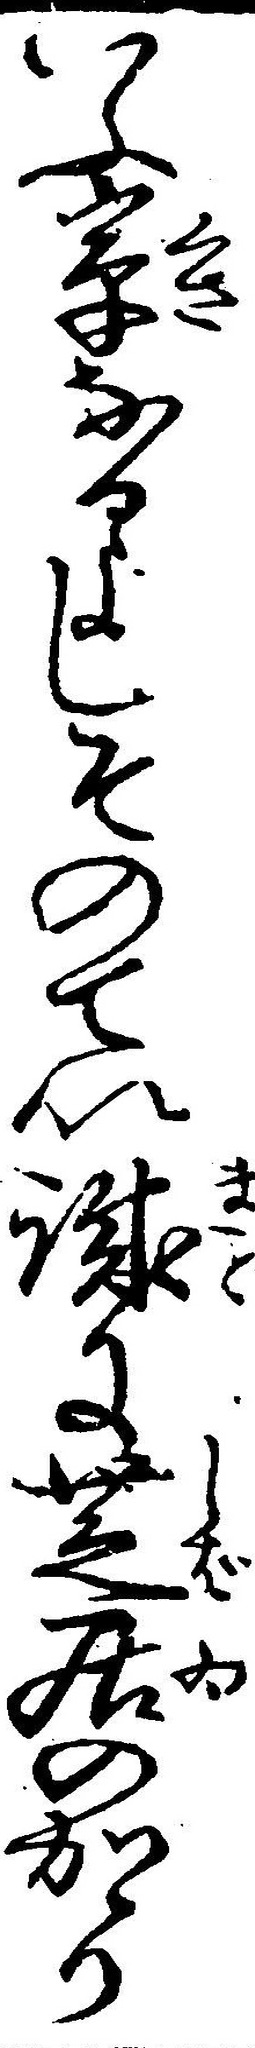いふ草なるほしそのてい誠に芝居のかゝり
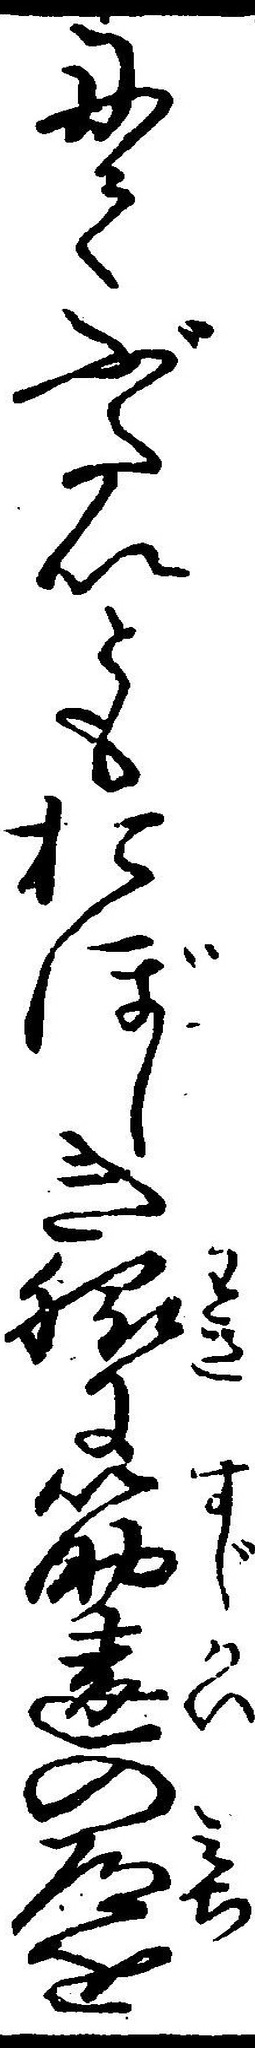にてぶたいともおぼしき脇に筋違の道を
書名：草木芝居化物退治 / 泉花堂三蝶(十六兵衛)作
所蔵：東京大学総合図書館 General Library in the University of Tokyo, JAPAN
